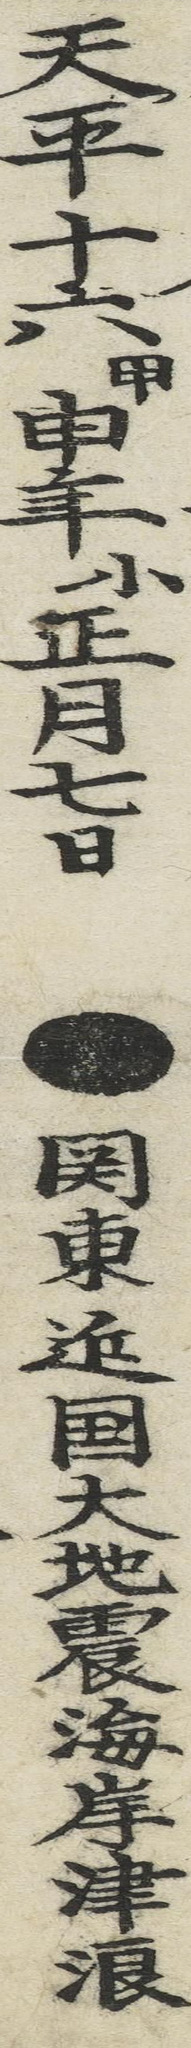天平十六甲申年小正月七日●関東近国大地震海岸津波

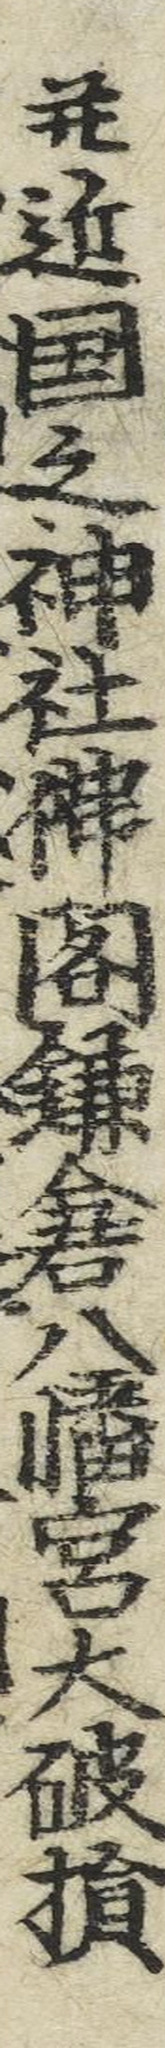并近国之神社仏閣鎌倉八幡宮大破損
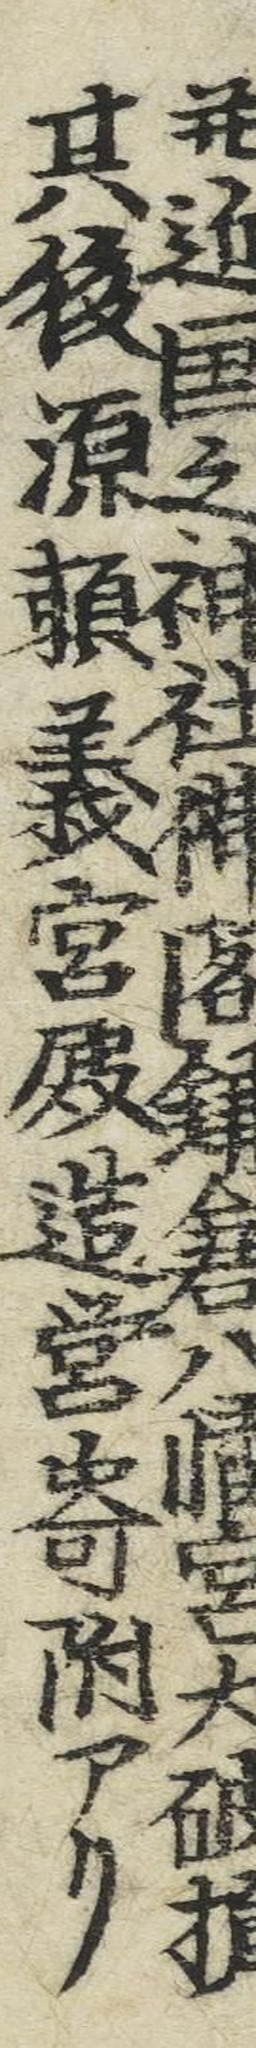其後源頼義宮殿造営寄附アリ
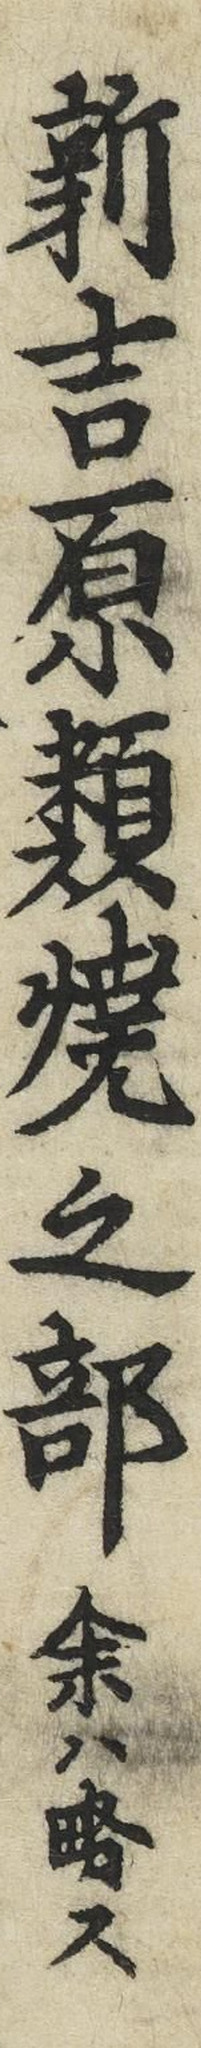新吉原類焼之部余ハ略ス
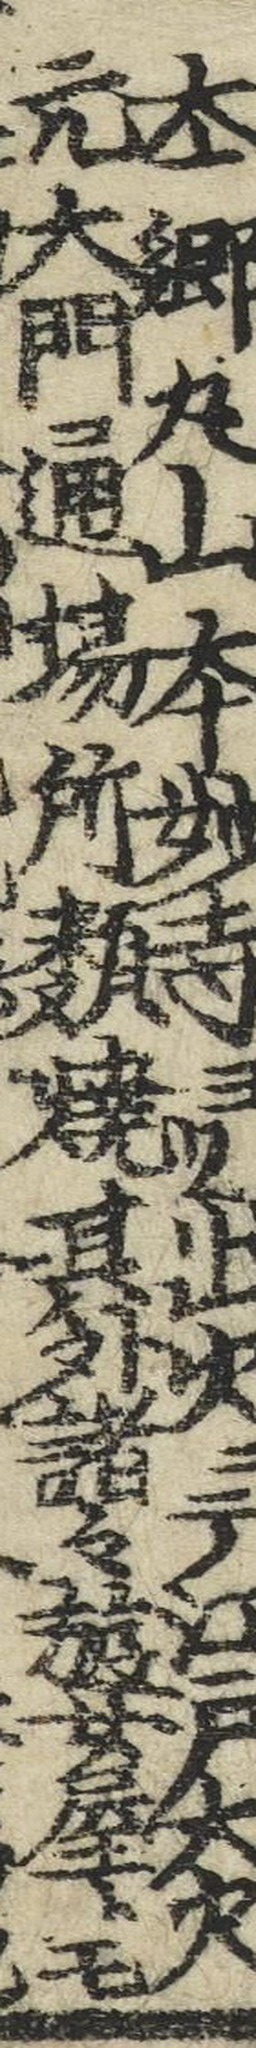元大門通場所類焼其外諸々遊女屋トモ
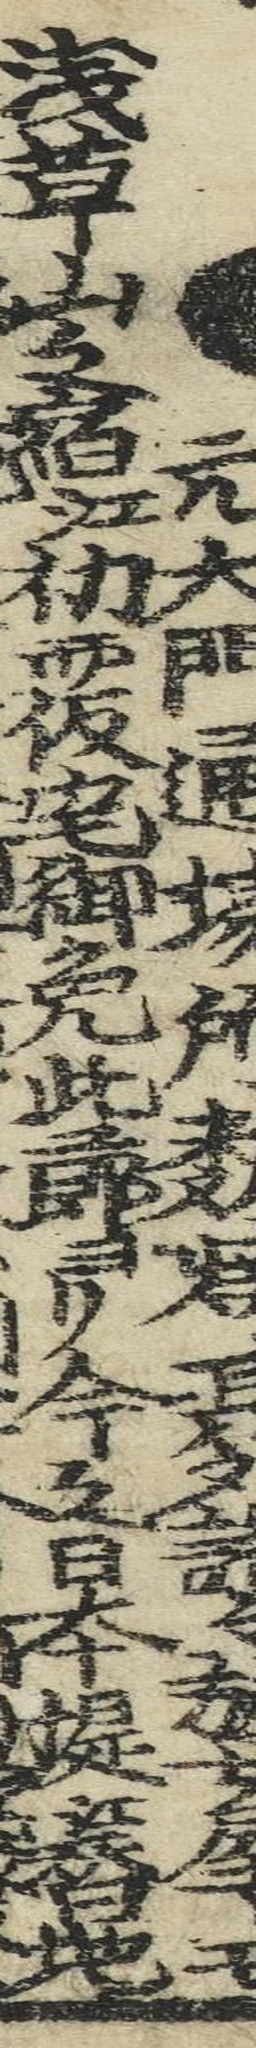浅草山之宿江初而仮宅御免此廊ヨリ今之日本堤江替地
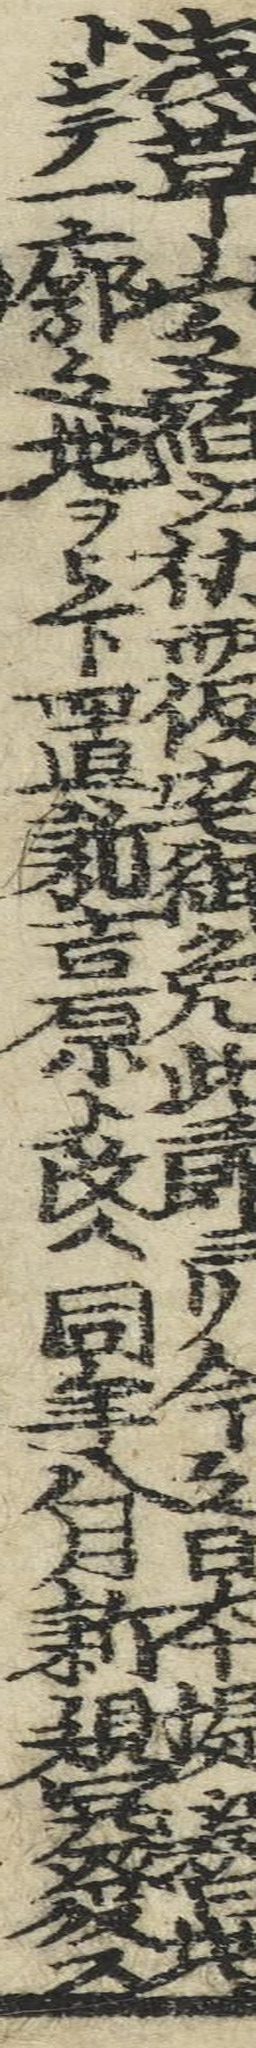トシテ一廓之地ヲ被下置新吉原ト改メ同年八月新規開発ス
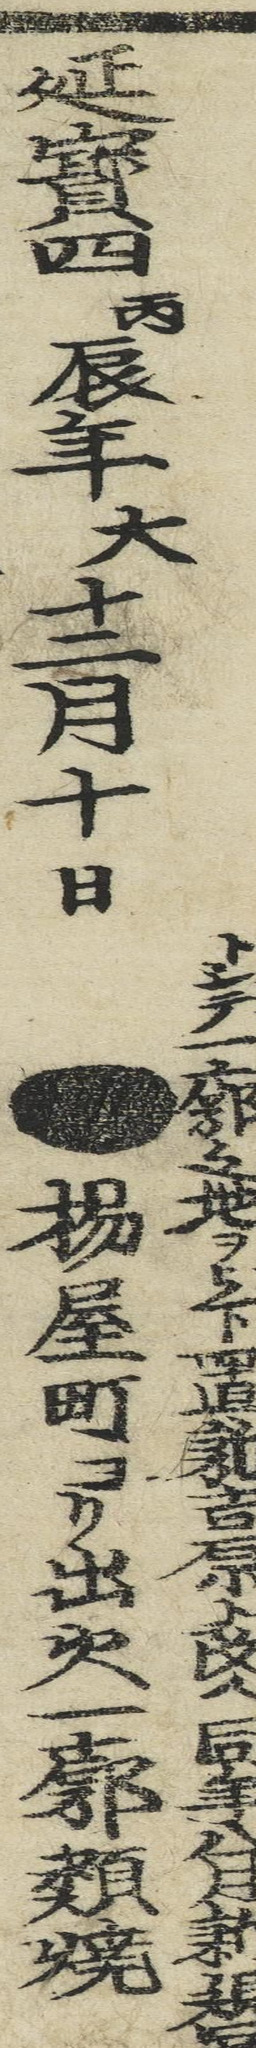延宝四丙辰年大十二月十日●揚屋町ヨリ出火一廓類焼
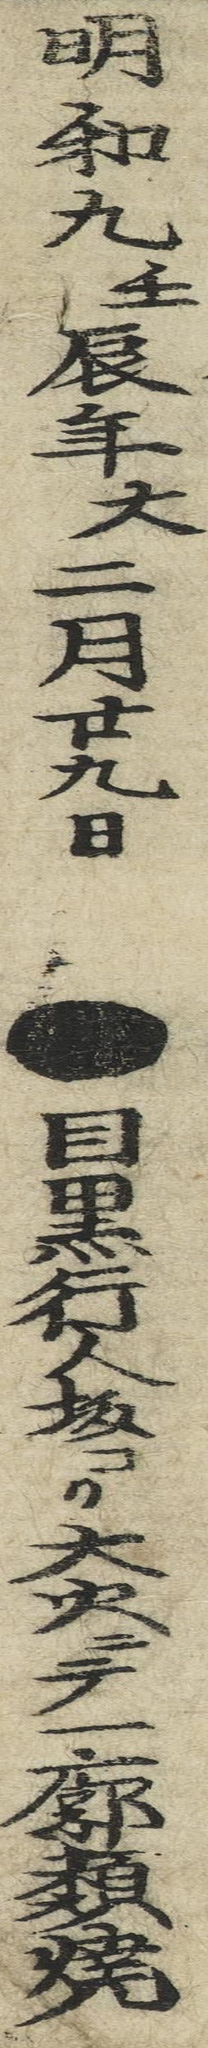明和九壬辰年大二月廿九日●目黒行人坂ヨリ大火ニテ一廓類焼
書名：非常日用記
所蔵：東京大学地震研究所図書室 Earthquake Research Institute Library, The University of Tokyo, JAPAN
